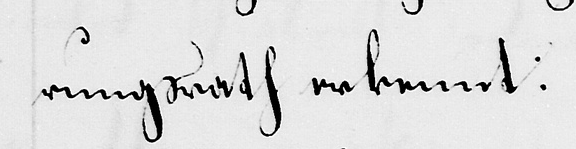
rungsrath erkannt:
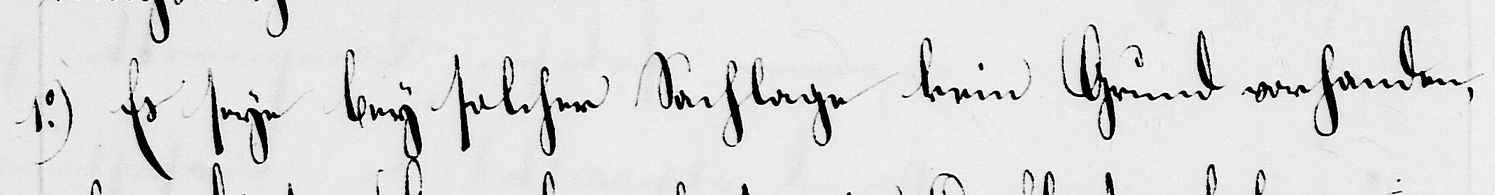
1.) Es seye bey solcher Sachlage kein Grund vorhanden,
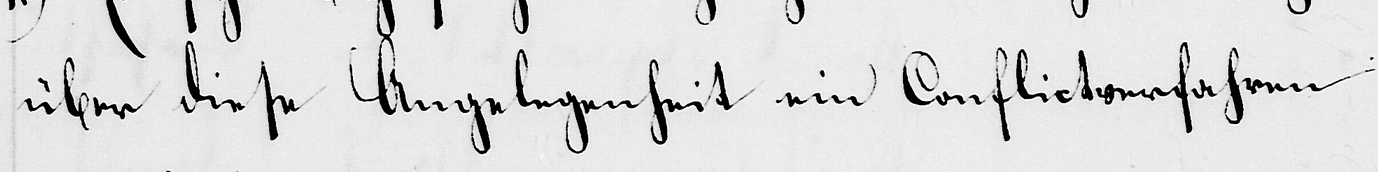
über diese Angelegenheit ein Conflictverfahren
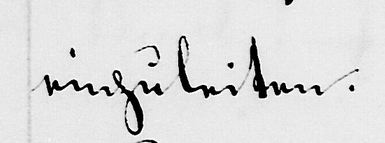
einzuleiten.
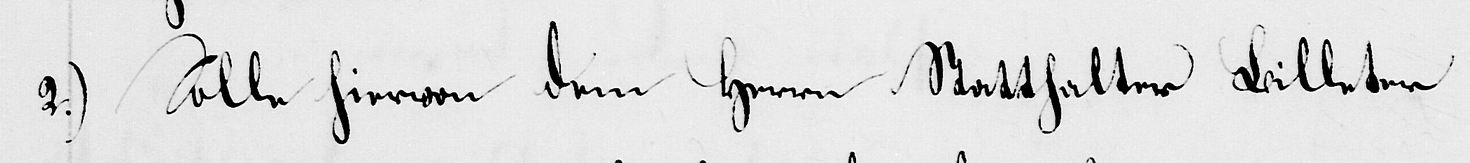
2.) Solle hiervon dem Herrn Statthalter Billeter
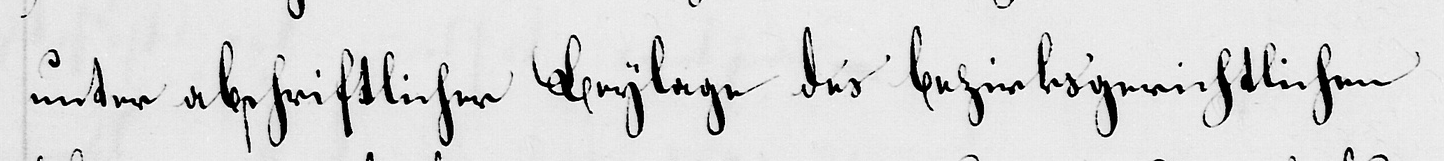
unter abschriftlicher Beylage des bezirksgerichtlichen
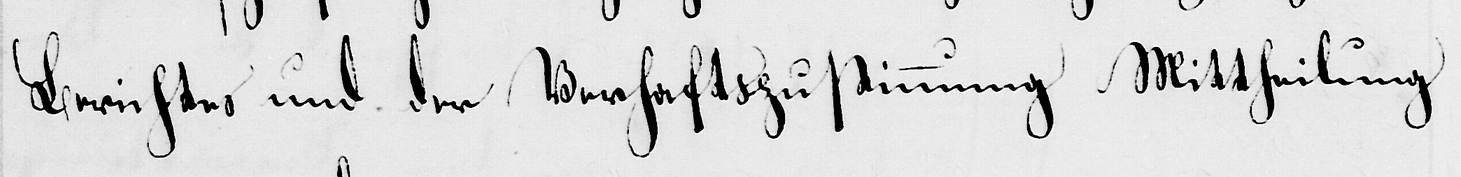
Berichtes und der Verhaftszustimmung Mittheilung
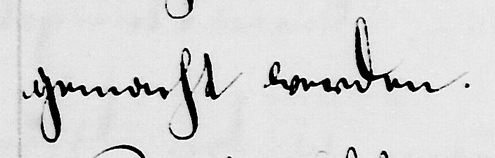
gemacht werden.
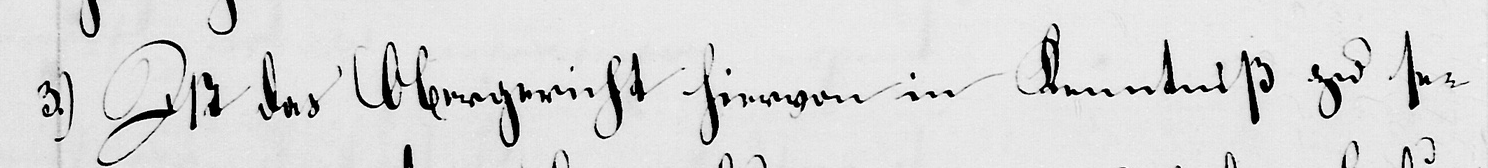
3.) Ist das Obergericht hiervon in Kenntniß zu se¬
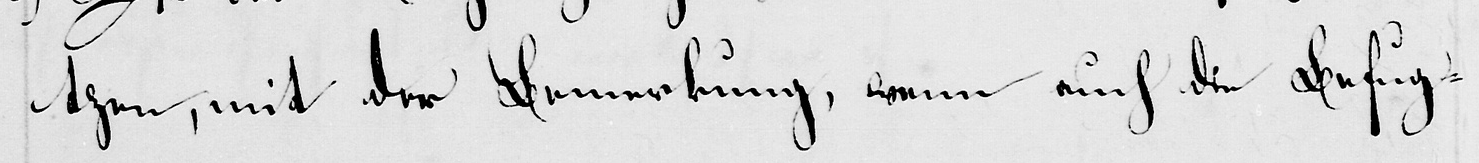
tzen, mit der Bemerkung, wenn auch die Befug-
